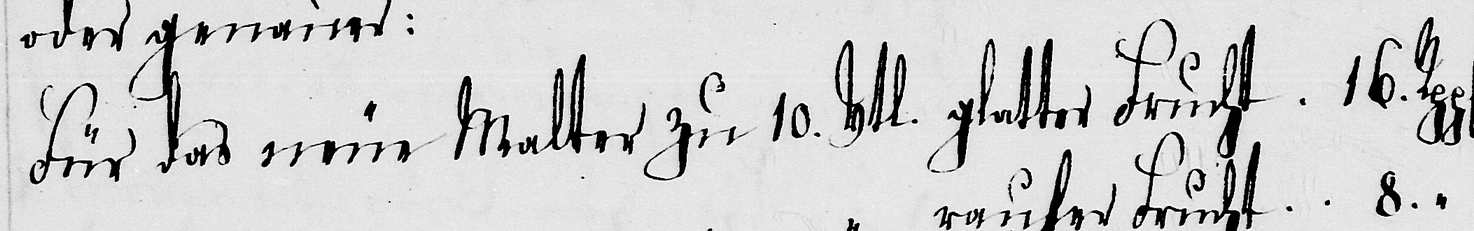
Für das neue Malter zu 10. Vlt. glatter Frucht . 10.
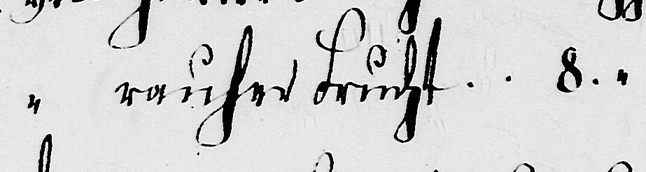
“ rauher Frucht . 8.
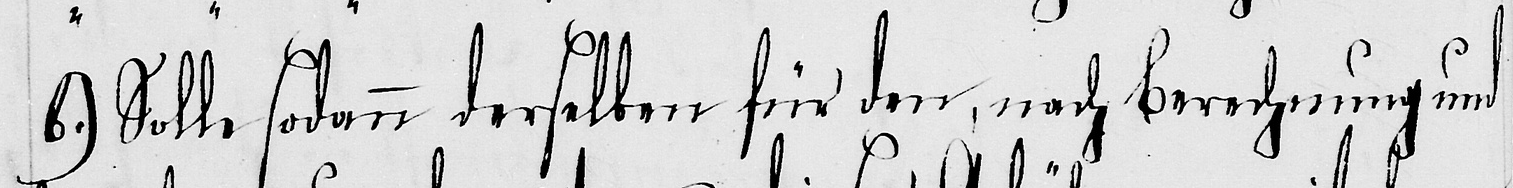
b.) Solle sodann derselben für den, nach Berechnung und
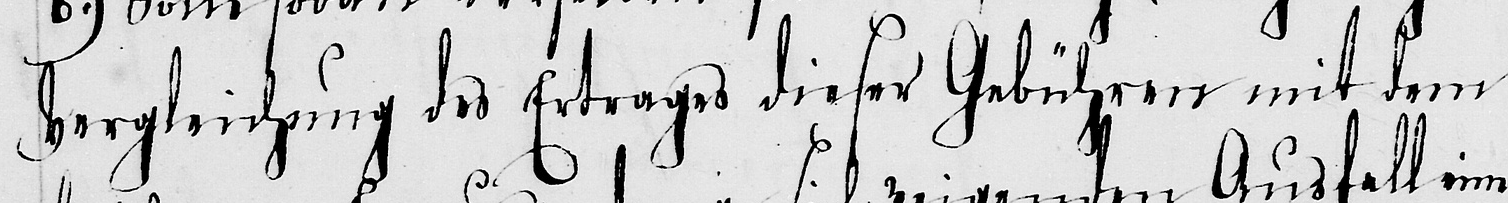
Vergleichung des Ertrages dieser Gebühren mit dem
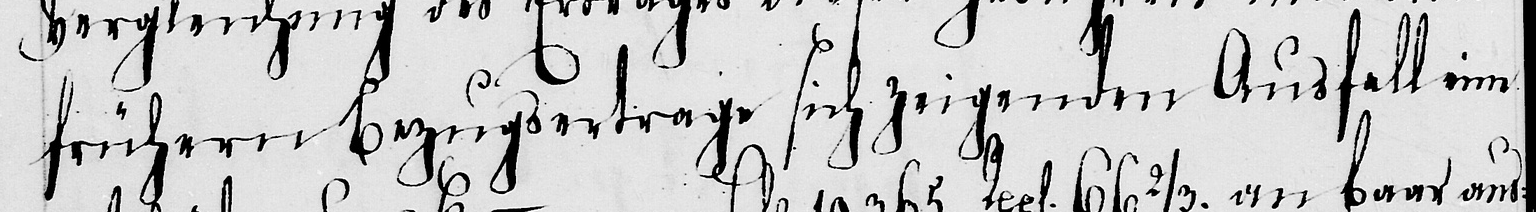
frühern Bezugsertrage sich zeigenden Ausfall e¬
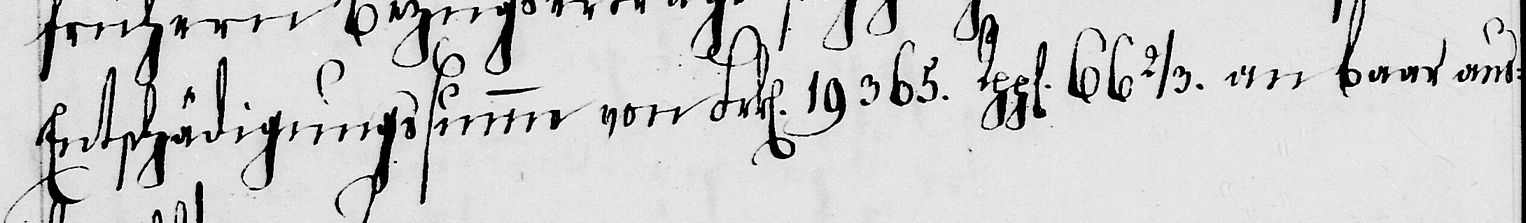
Entschädigungssumme von Frk[en]. 19365. Rpp[en]. 66⅔. an baar aus¬
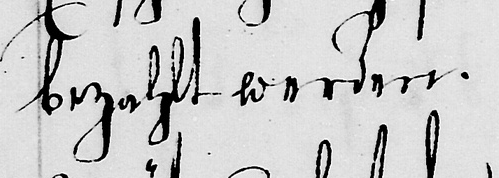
bezahlt werden.
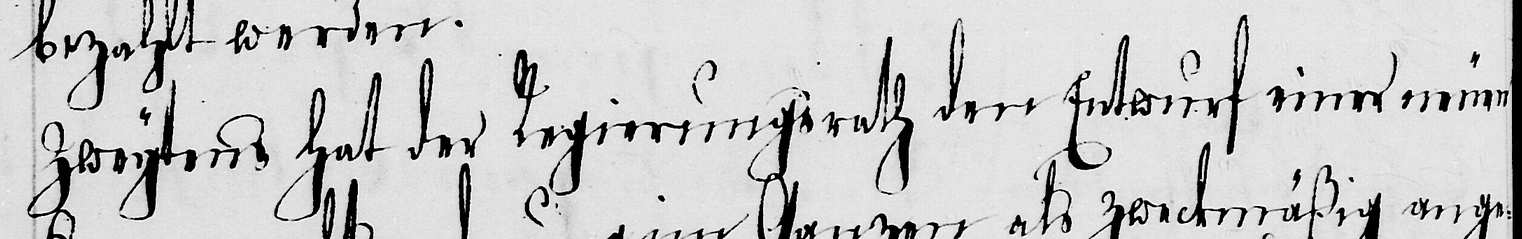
Zweytens hat der Regierungsrath den Entwurf einer neuen
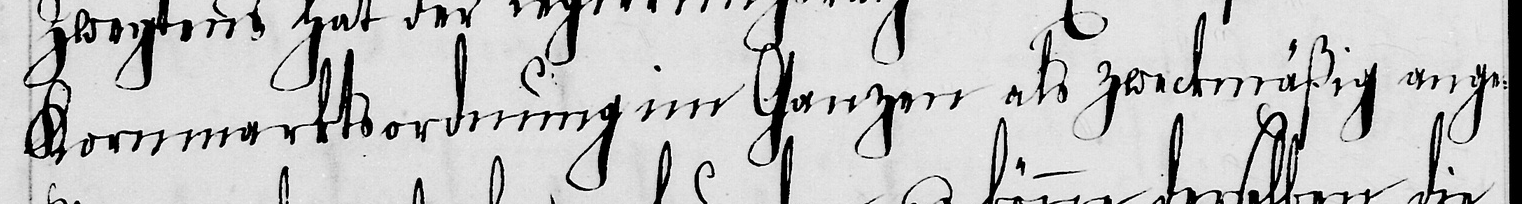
Kornmarktsordnung im Ganzen als zweckmäßig ange¬
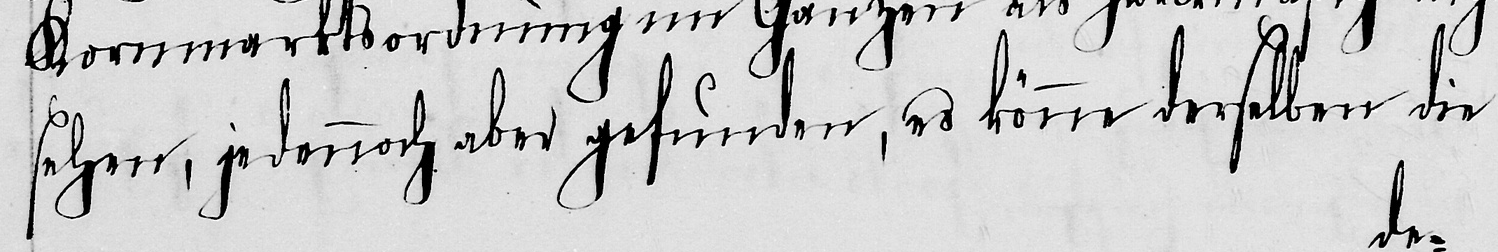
sehen, jedennoch aber gefunden, es könne derselben die
